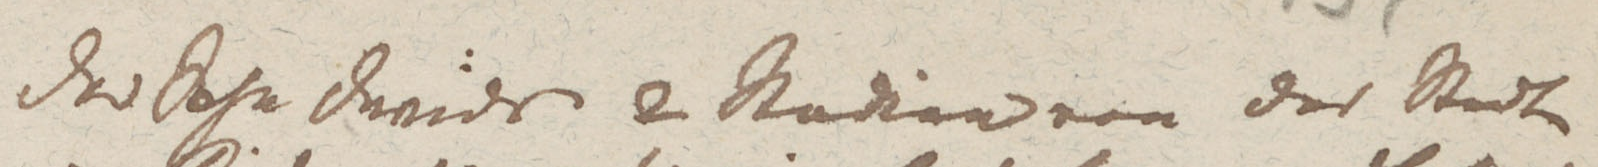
ser Sohn Davids 2 Stadien von der Stadt
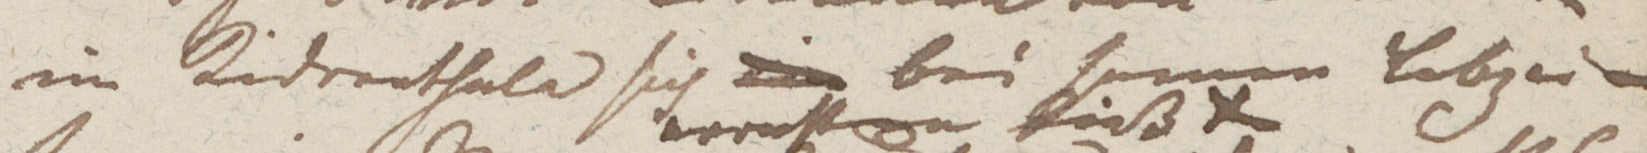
im Kidronthale sich in bei seinen Lebzei-
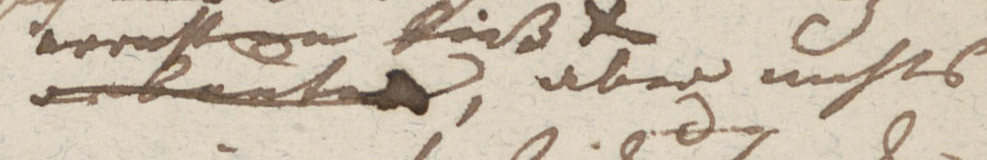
errichten liess%, aber nichts
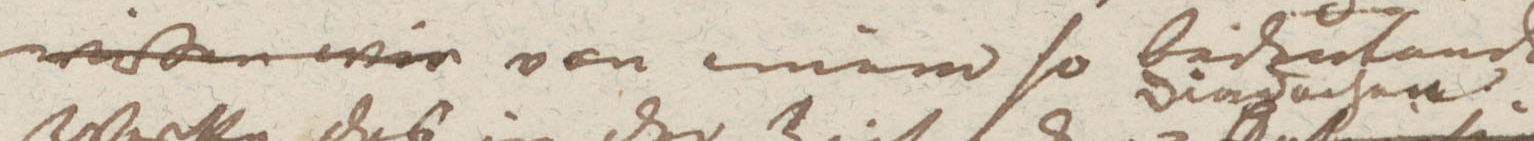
wissen wir von einem so bedeutenden
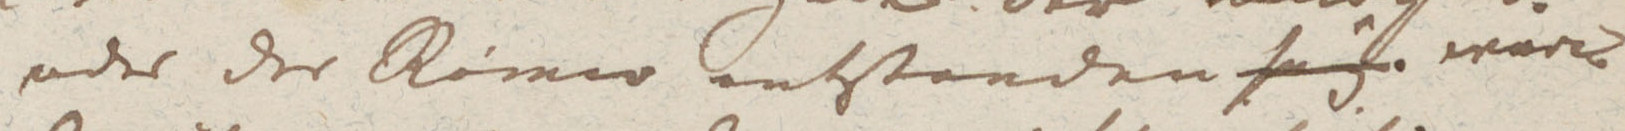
oder der Römer entstanden seyn wäre.
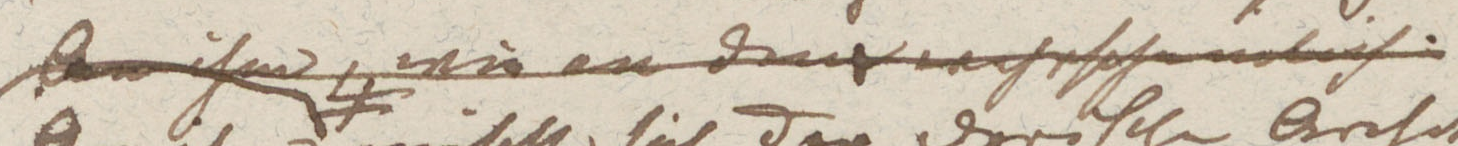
An ihm, wie an dem wahrscheinlich
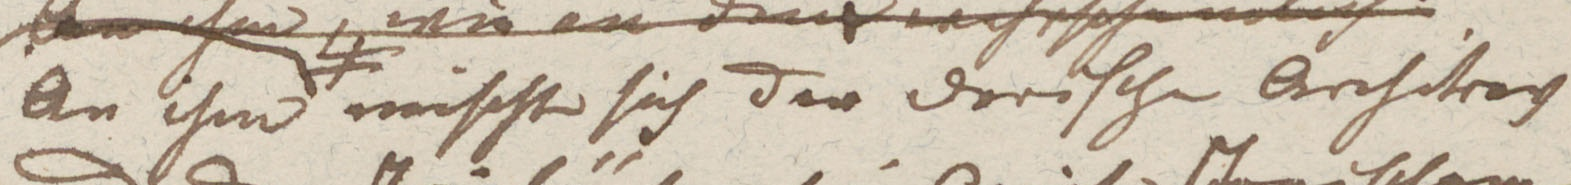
An ihm % mischt sich der Dorische Architrav
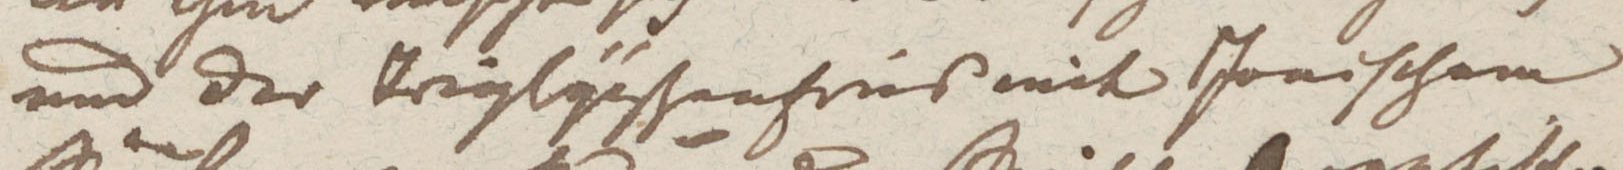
und der Triglyphenfries mit Ionischem
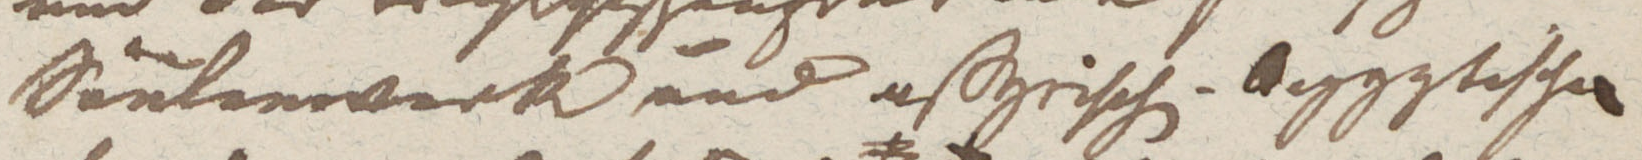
Säulenwerk und assyrisch-Aegyptische
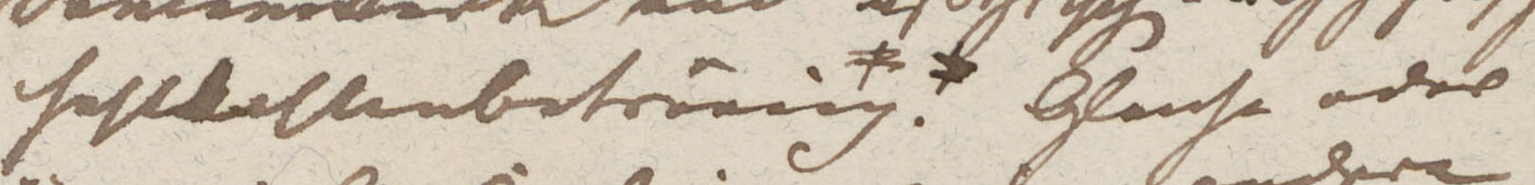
Hohlkehlenbetrönung%. Gleiche oder
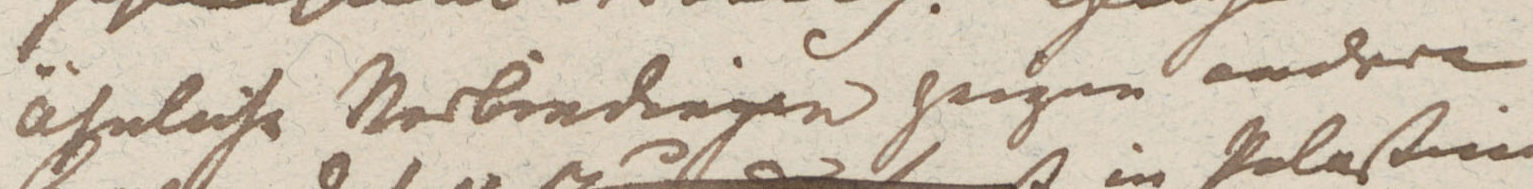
ähnliche Verbindungen zeigen andere
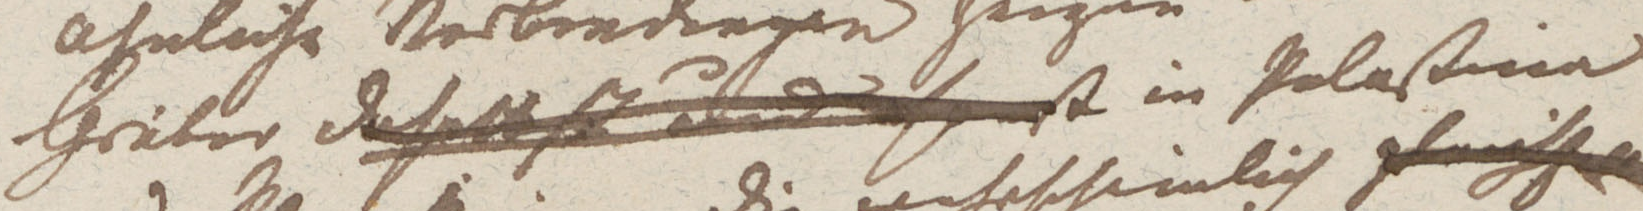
Gräber daselbst und sonst in Palestina
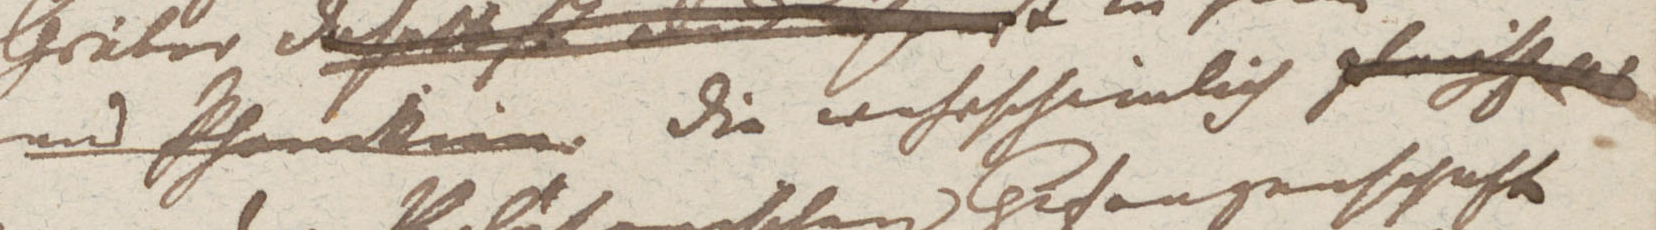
und Phönikien die wahrscheinlich gleichfalls
